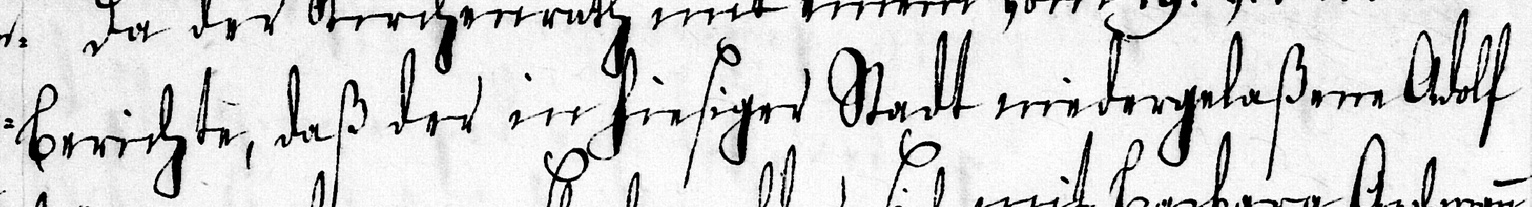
Berichte, daß der in hiesiger Stadt niedergelaßene Adolf
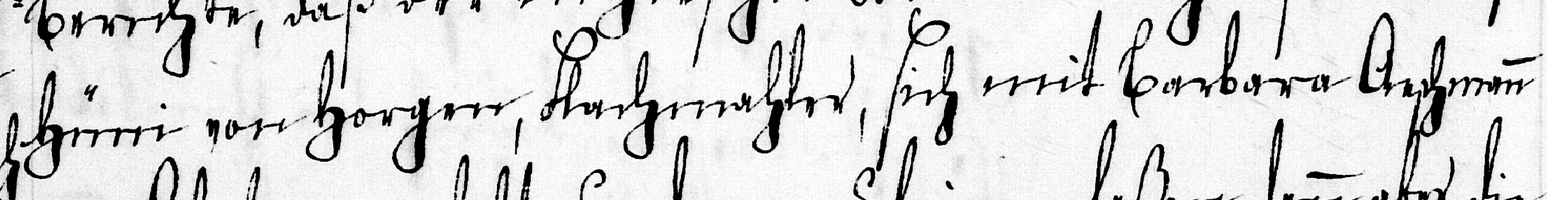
Hüni von Horgen, Flachmahler, sich mit Barbara Aeschmann
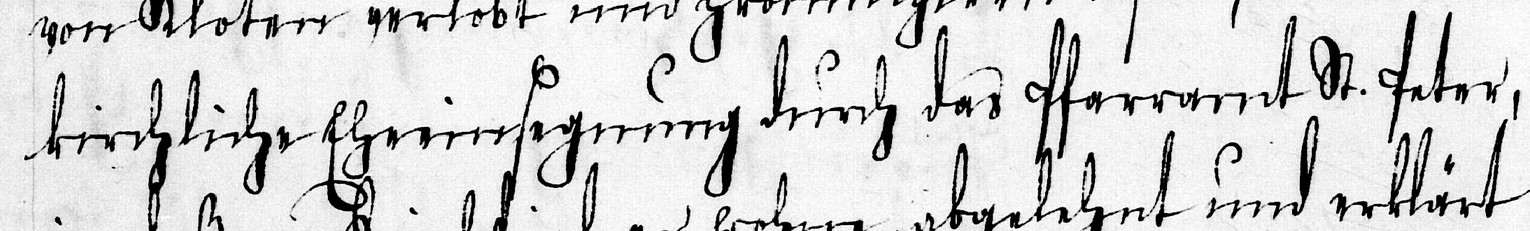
kirchliche Eheeinsegnung durch das Pfarramt St. Peter,
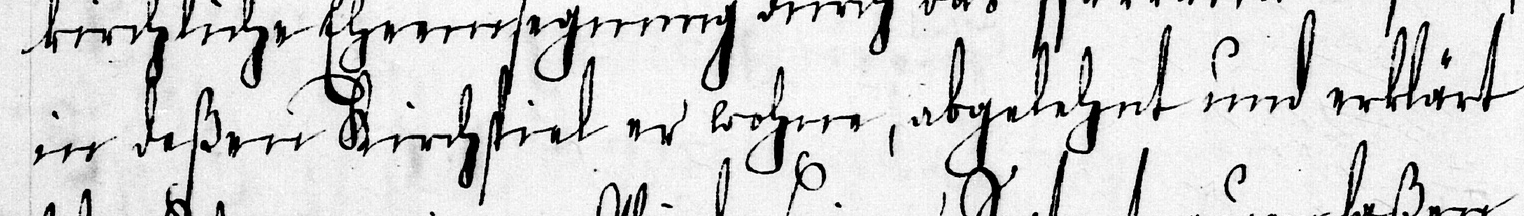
in deßen Kirchspiel er wohne, abgelehnt und erklärt
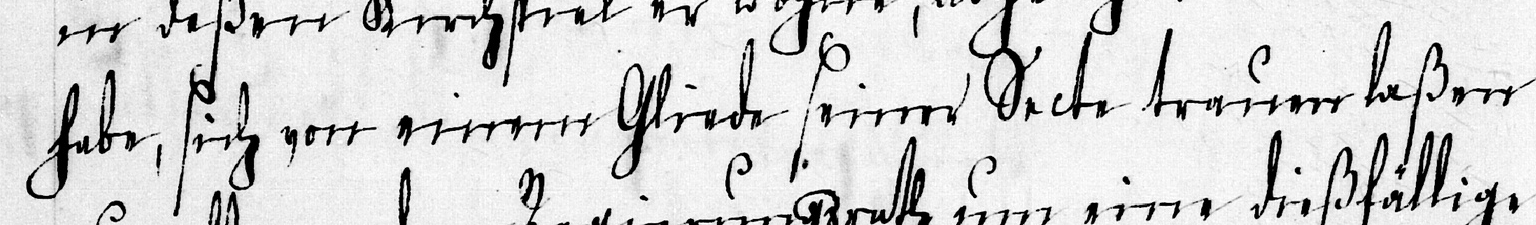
habe, sich von einem Gliede seiner Secte trauen laßen
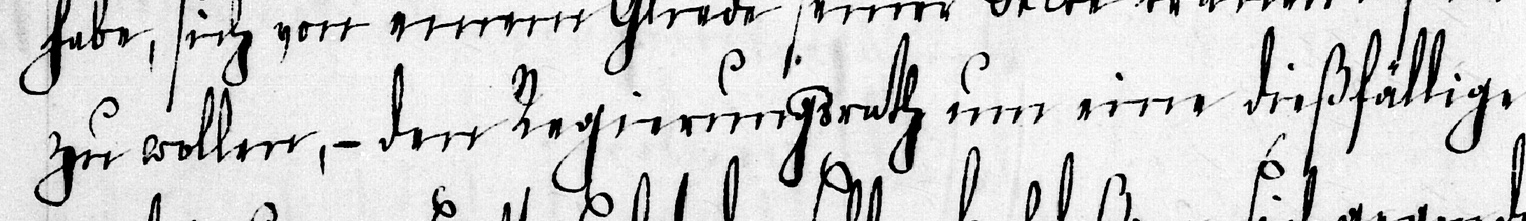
zu wollen, – den Regierungsrath um eine dießfällige
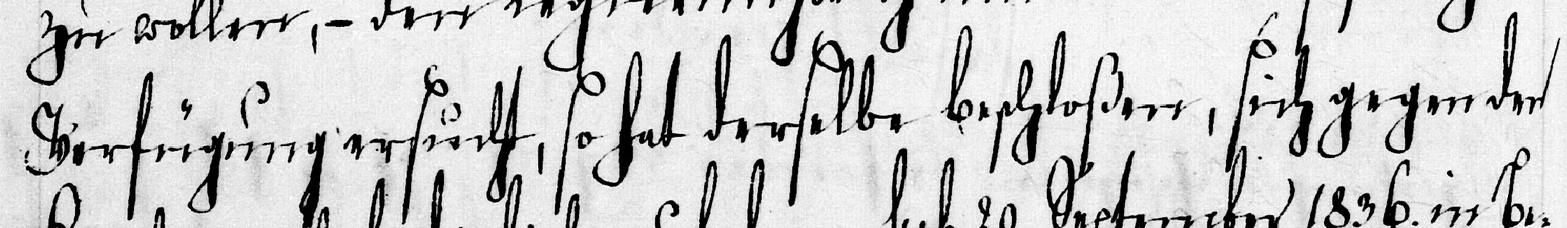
Verfügung ersucht, so hat derselbe beschloßen, sich gegen
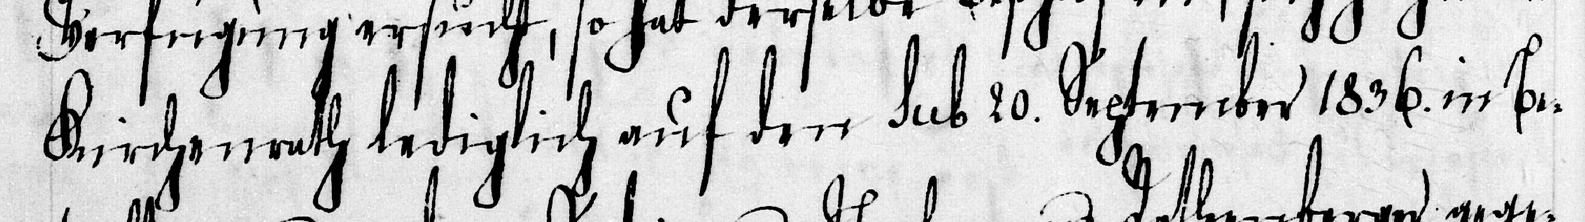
Kirchenrath lediglich auf den sub. 20. September 1836. in B¬
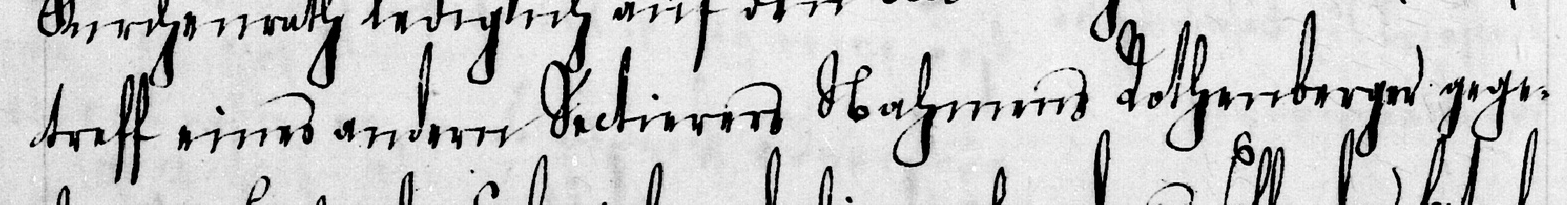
etreff eines andern Sectierers Nahmens Rothenberger gege¬
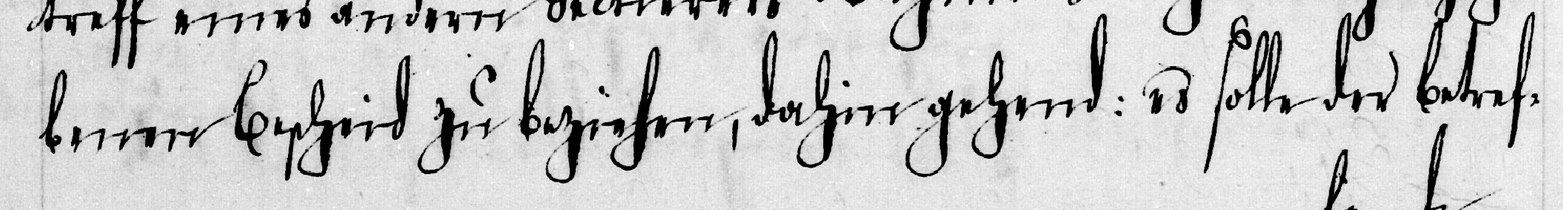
benen Bescheid zu beziehen, dahin gehend: es solle der betre¬
